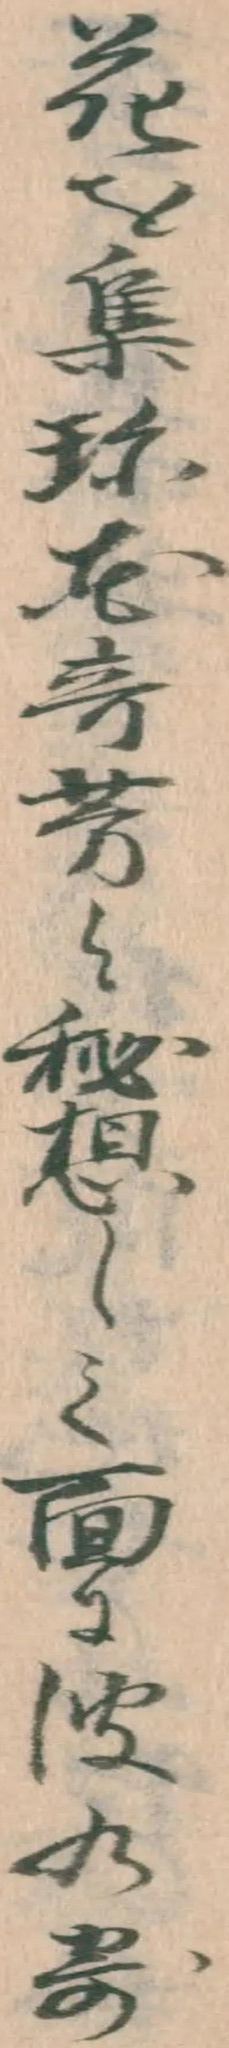花を集珍花奇芳の秘想して面に波の寄
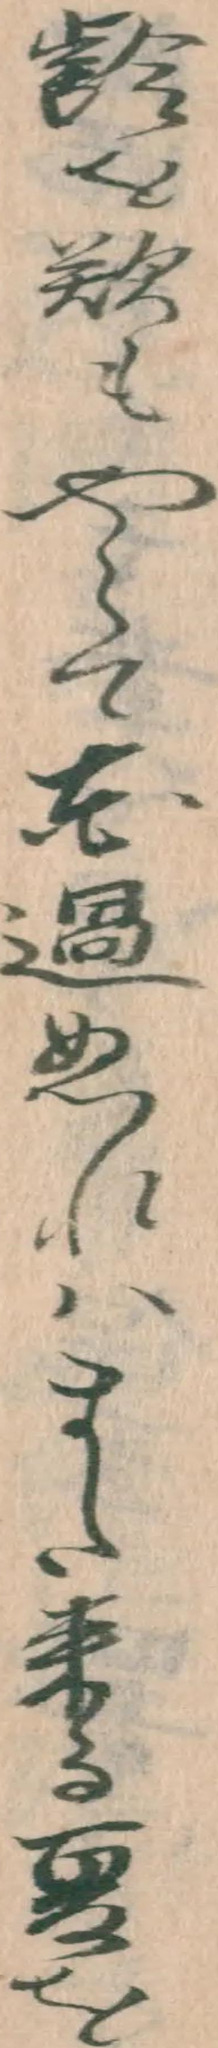齢を歎もやとて花過ぬれハまた来る夏を
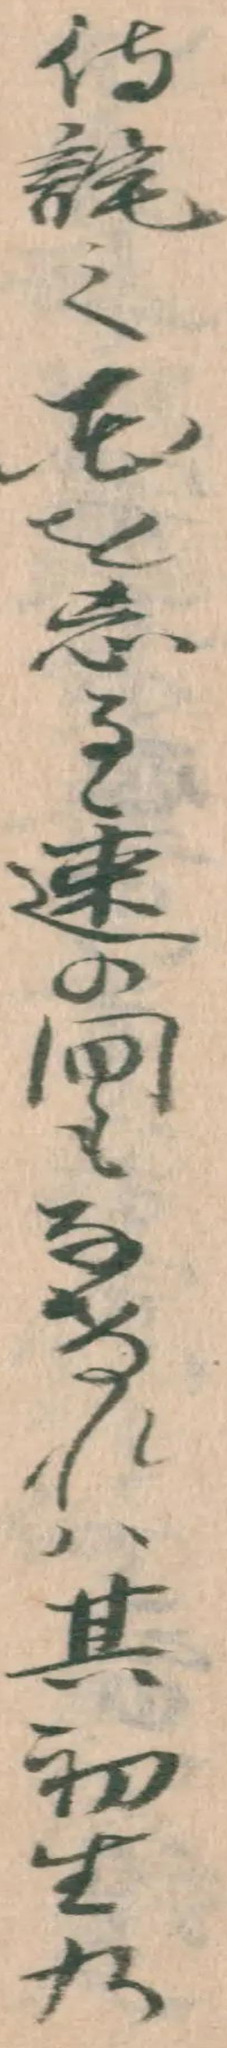待詫て花を忘るゝ速の間もなけれハ其初生の
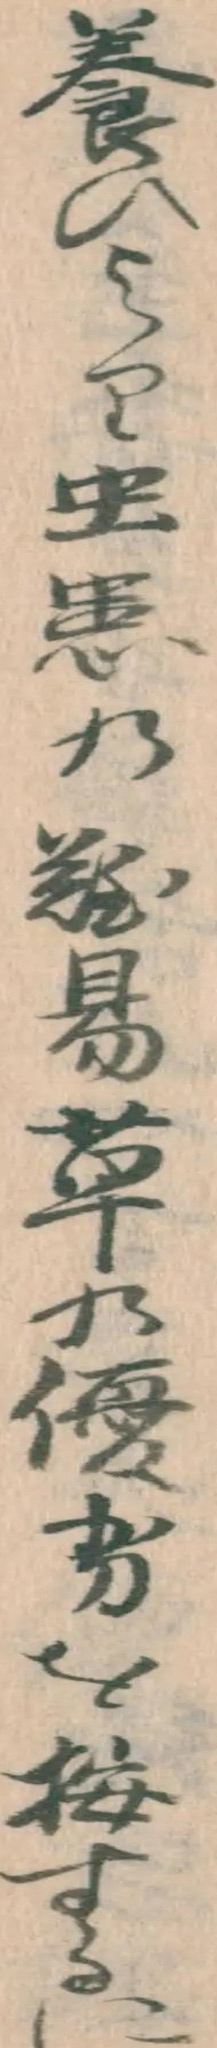養ひとり虫患の難易草の優劣を按するに
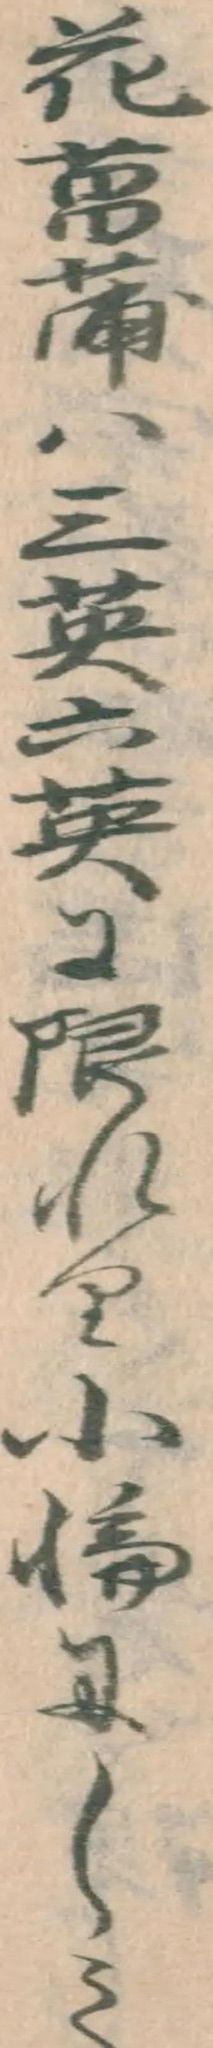花菖蒲ハ三英六英に限れり小輪にして
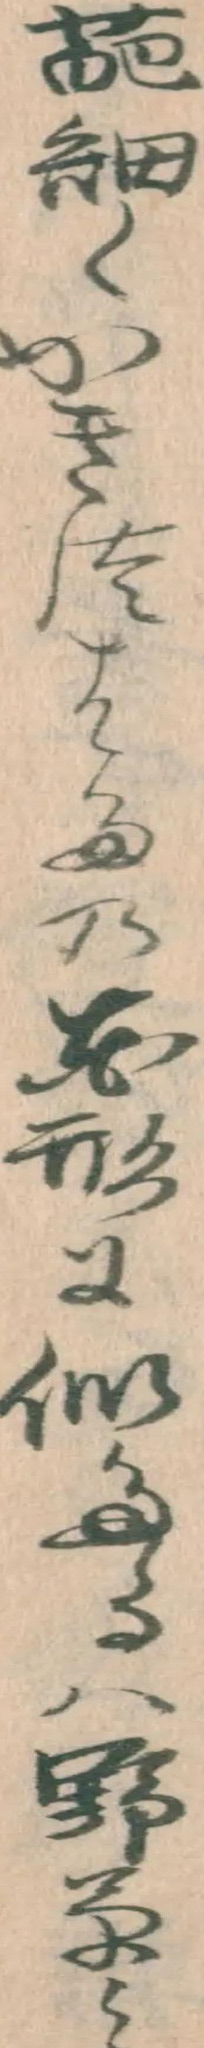葩細くかきつはたの花形に似たるハ野草と
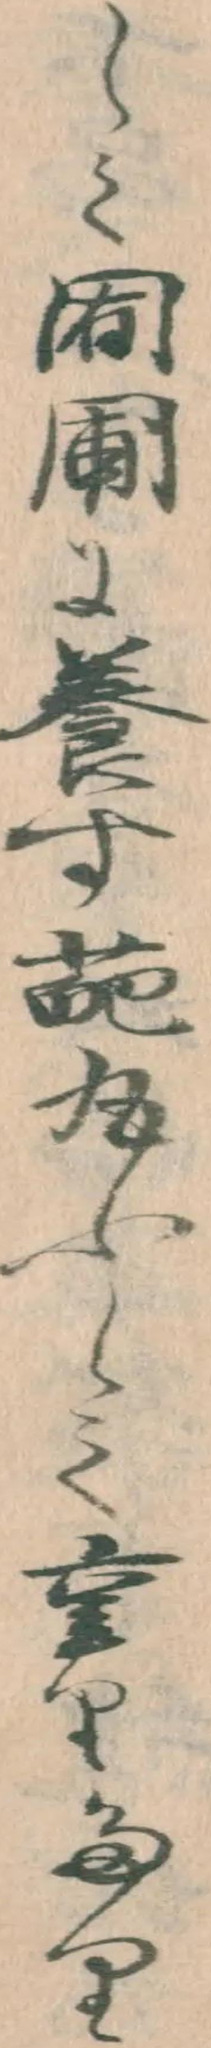して囿圃に養す葩丸にして重りたり
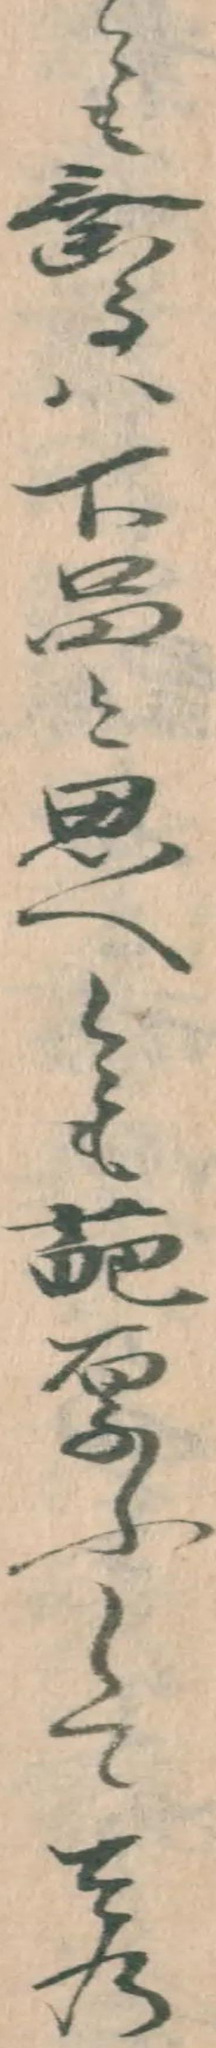とも垂るハ下品と思へとも葩厚ふしてその

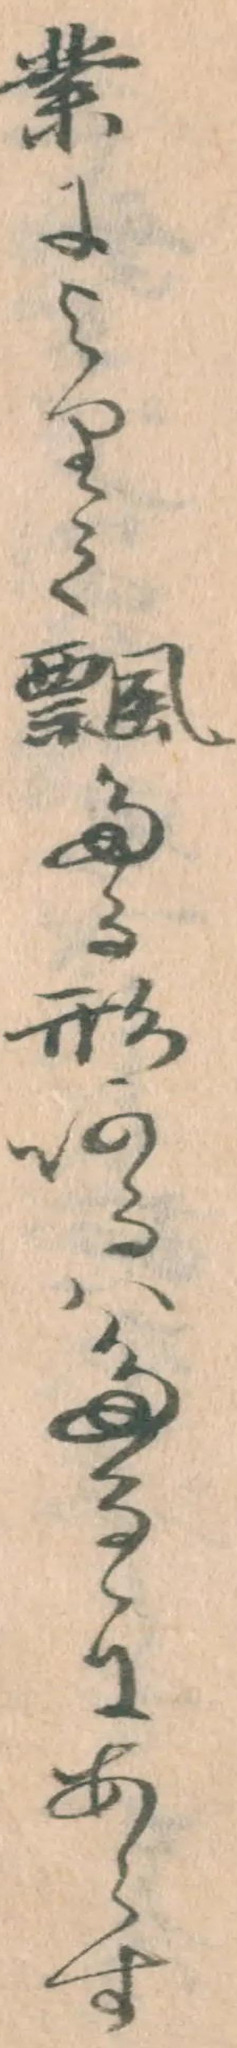業によりて飄たる形あるハたるゝにあらす
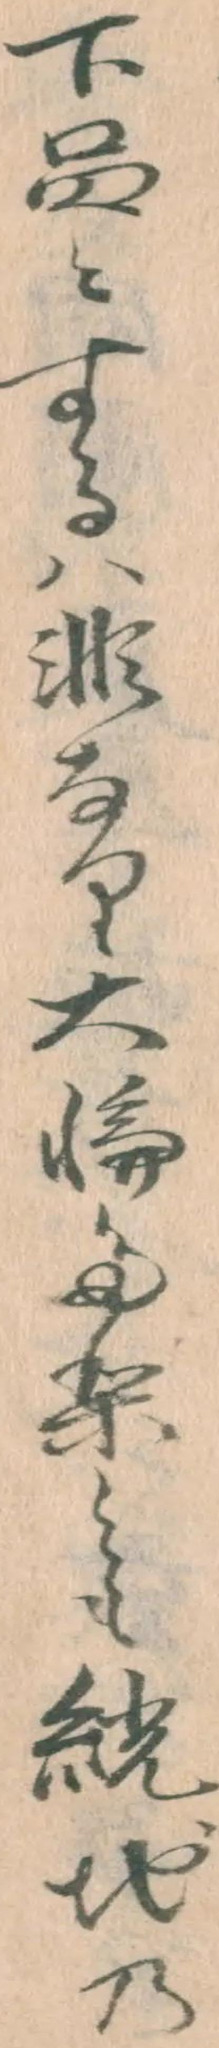下品とするハ非なる大輪たりとも絖地の
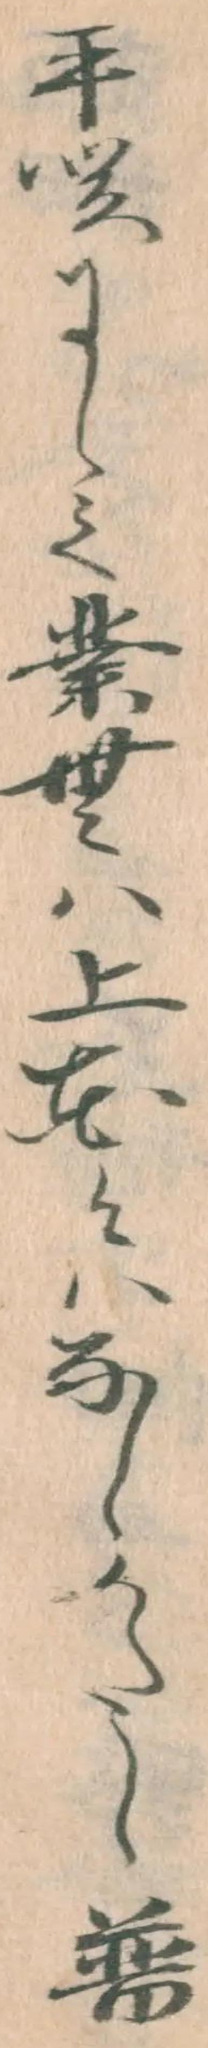平咲にて業無ハ上花とハなしかたし普
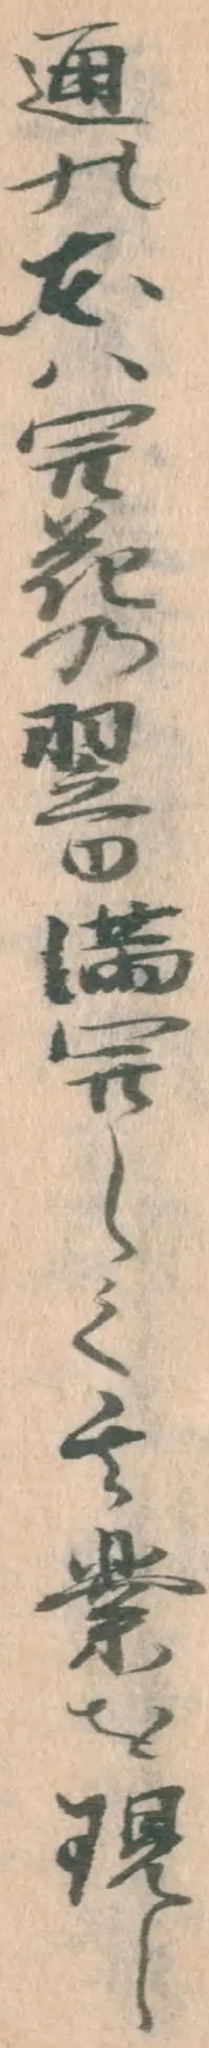通の花ハ開花の翌日満開して其業を現し
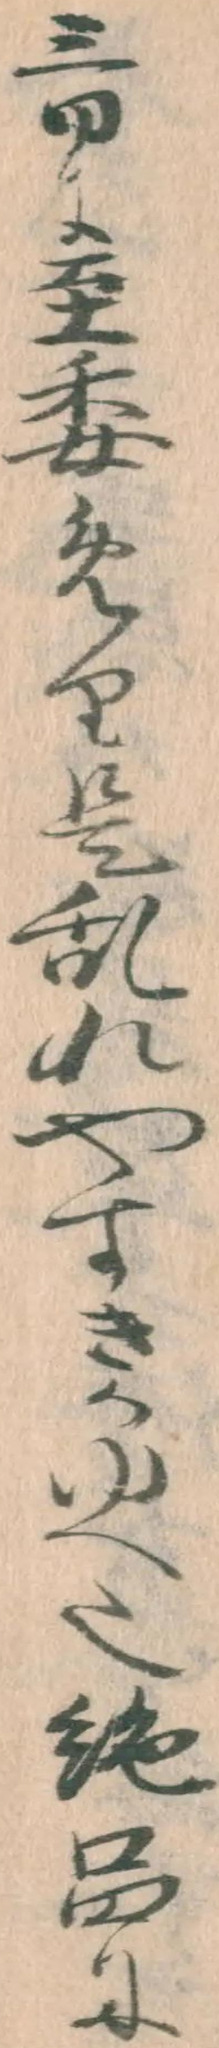三日に至委めり是乱れやすきかゆえ也絶品に
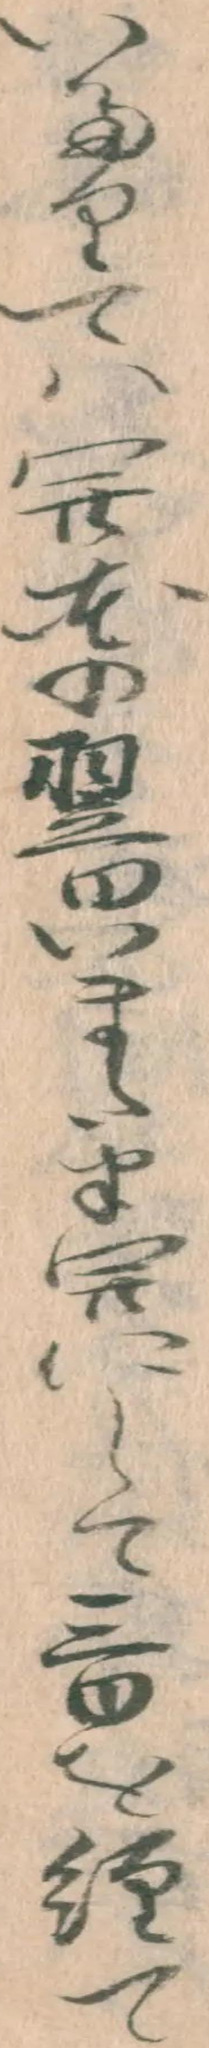いたりてハ開花の翌日いまた半開にして三日を経て
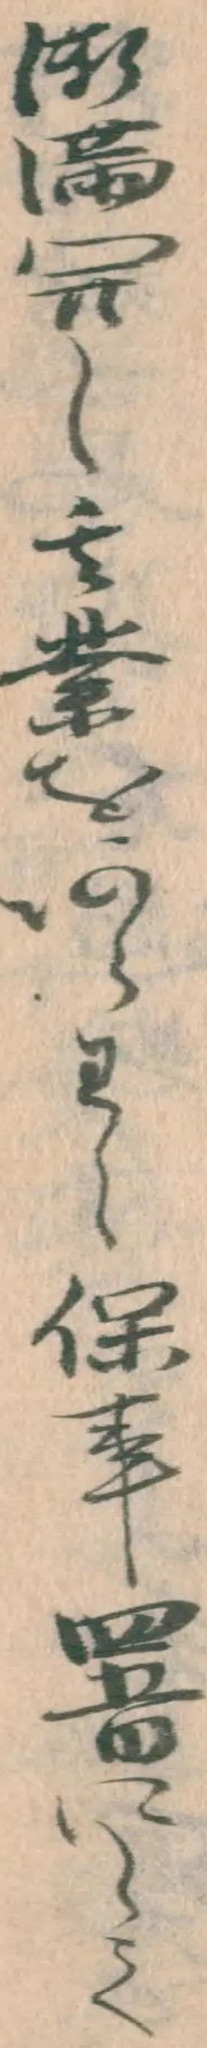漸満開し其業をあらわし保事四五日にして
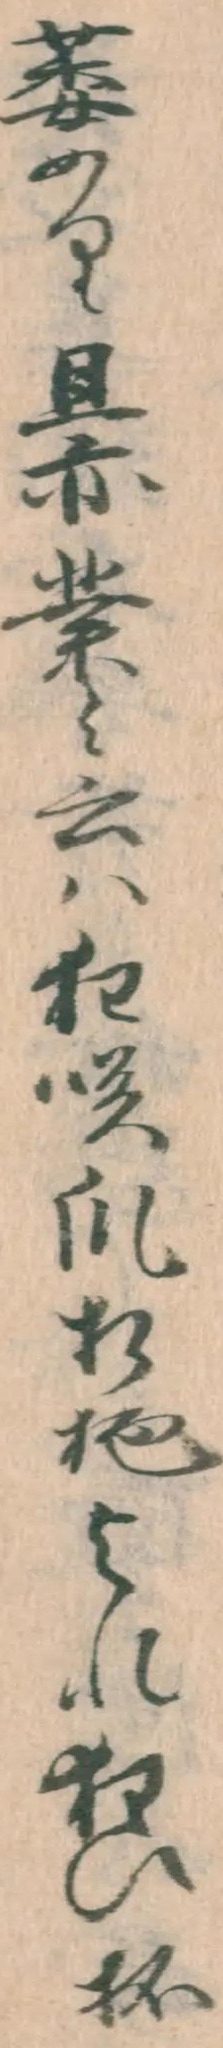萎めり且亦業と云ハ狂咲爪折杷よれ狂ひ抔
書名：花菖培養録
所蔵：国立国会図書館 National Diet Library, JAPAN
